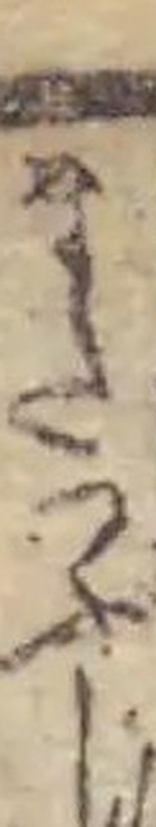またつぶし
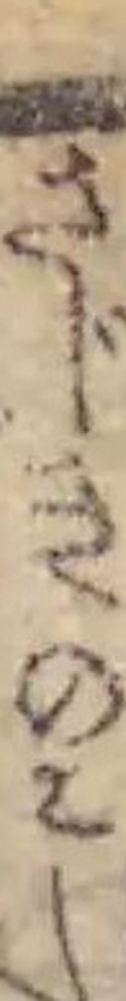さじきのこ
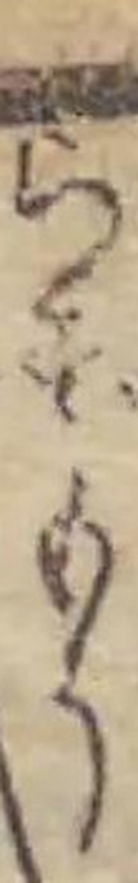らずもう
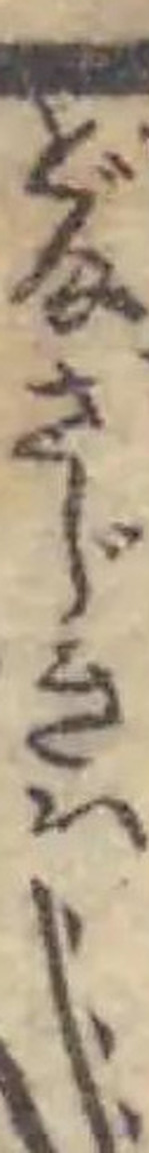どまさじきハ
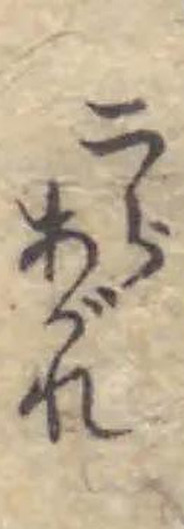あがれ
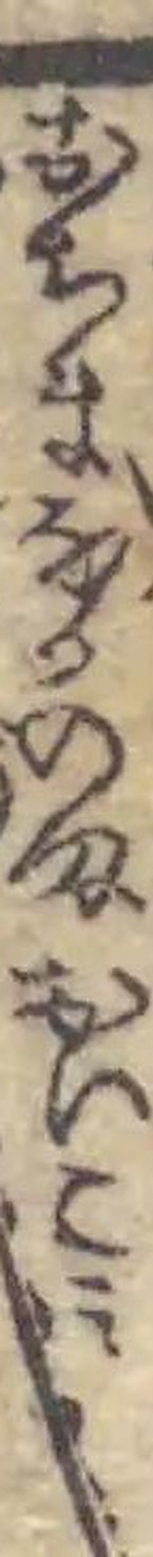おちまなるのまおいこミ
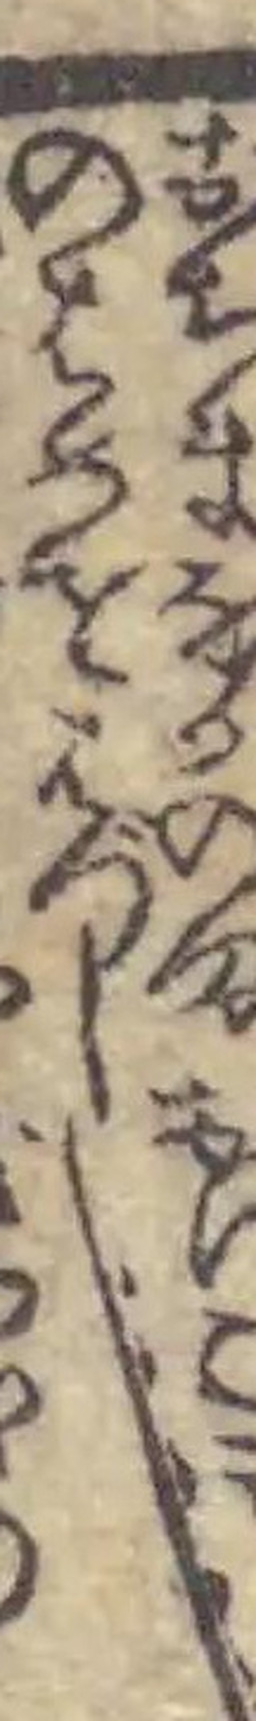のはめをはづし
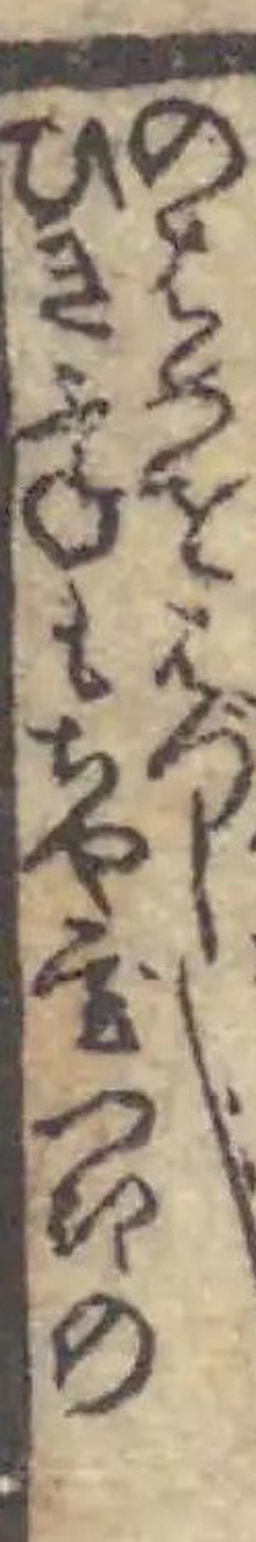ひきふねもちや屋つきの
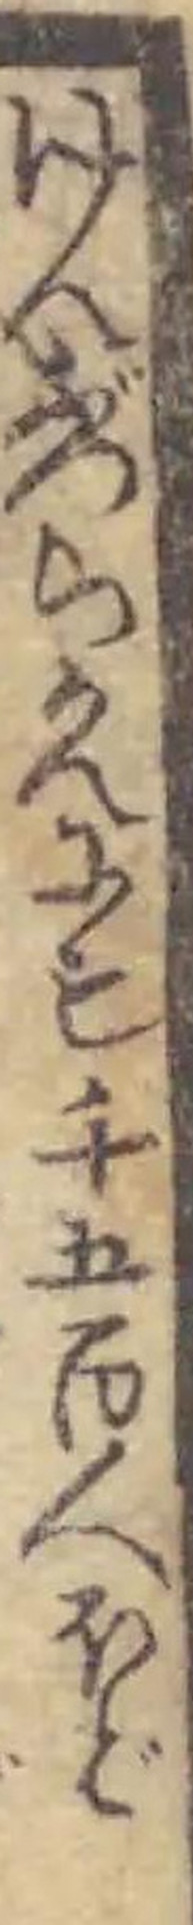けんぶつらかんにも千五百人ほど
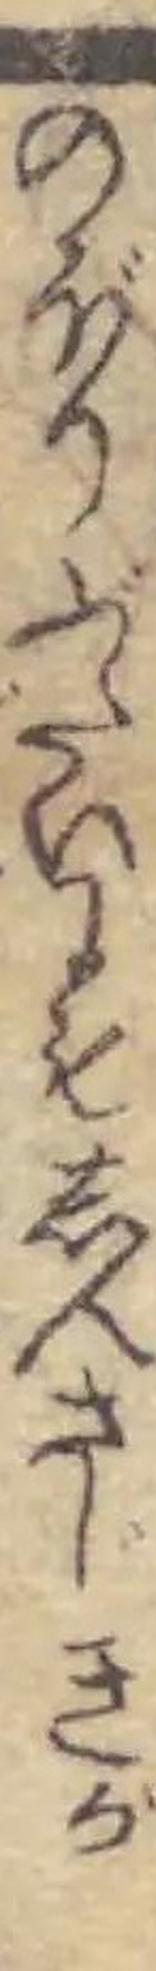のぼりぶたいにもしんさじきが
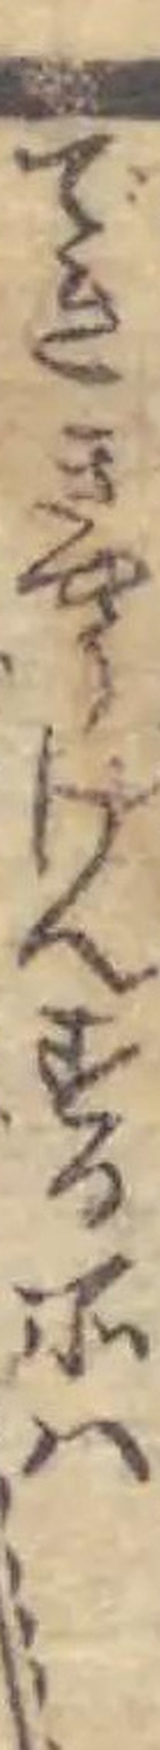でききやうげんする所ハ
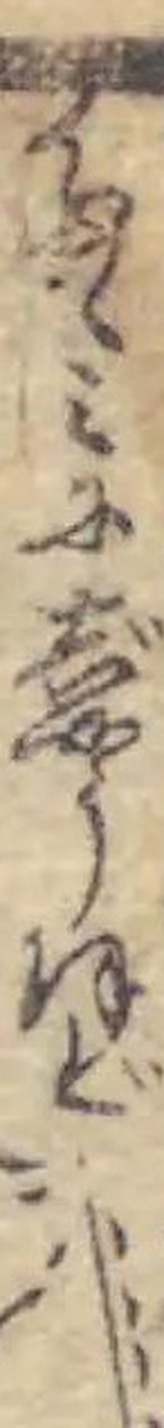たゝミにじやうほど
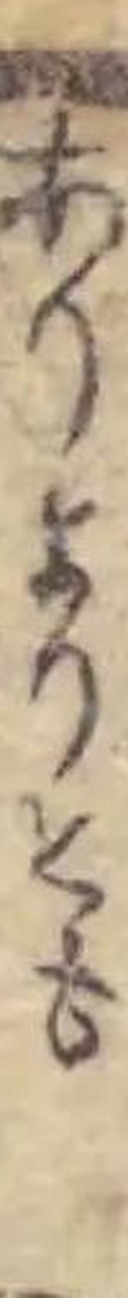ありよりとも
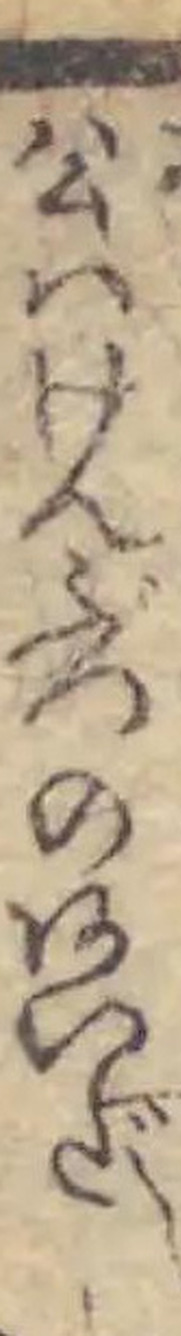公ハけんぶつのあいだ
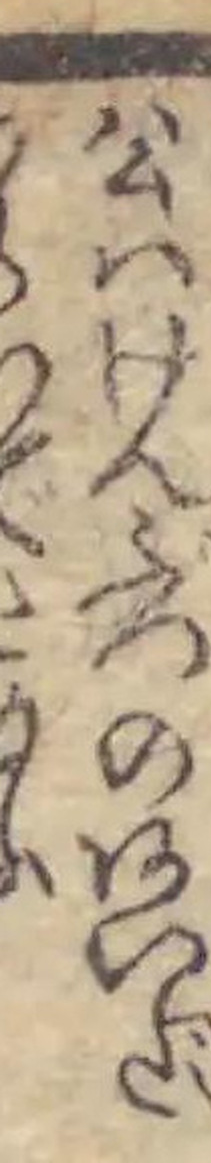からいでたまふ
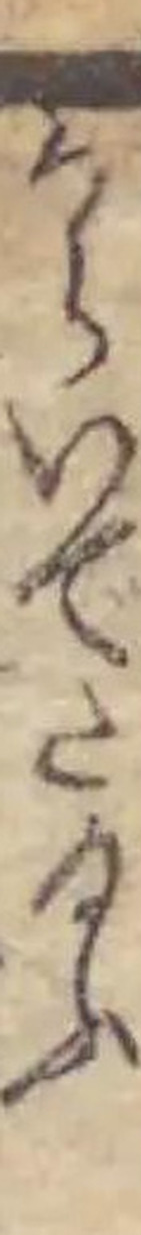からいでたまふ
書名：豆男江戸見物 2巻
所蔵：国立国会図書館 National Diet Library, JAPAN
